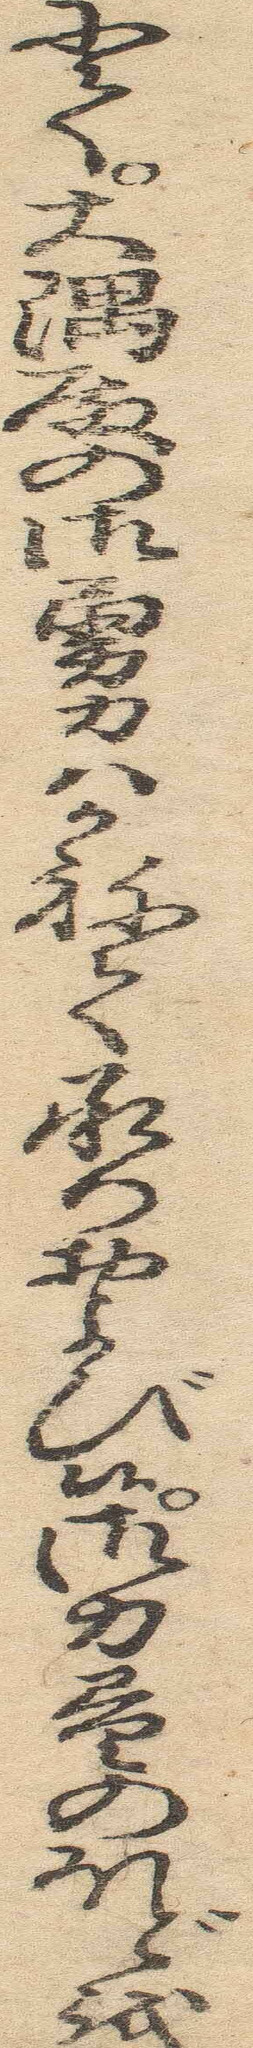にて。大隅殿の御勇力はかねて承りおよび候。御力量のほどを
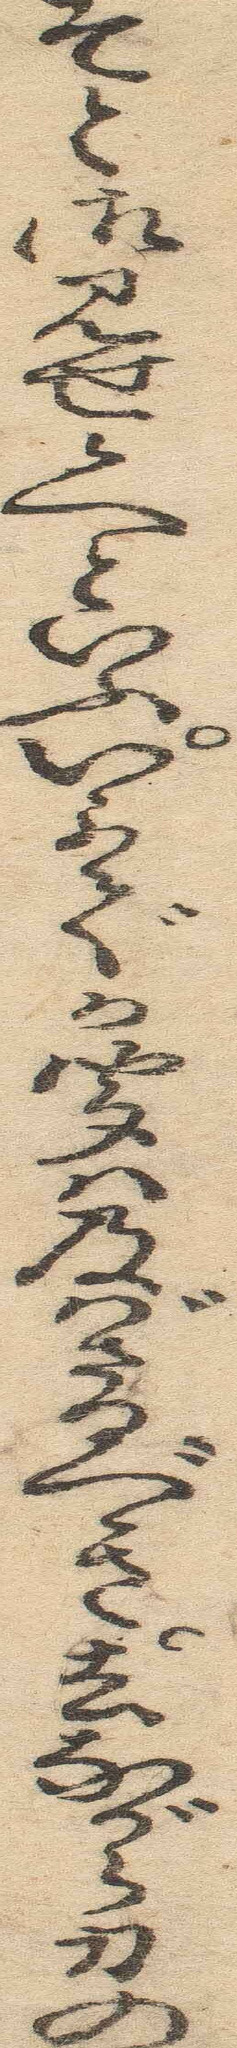そく御見せ候へといふ。いかでか聞は及ばざるべき。去ながら力の
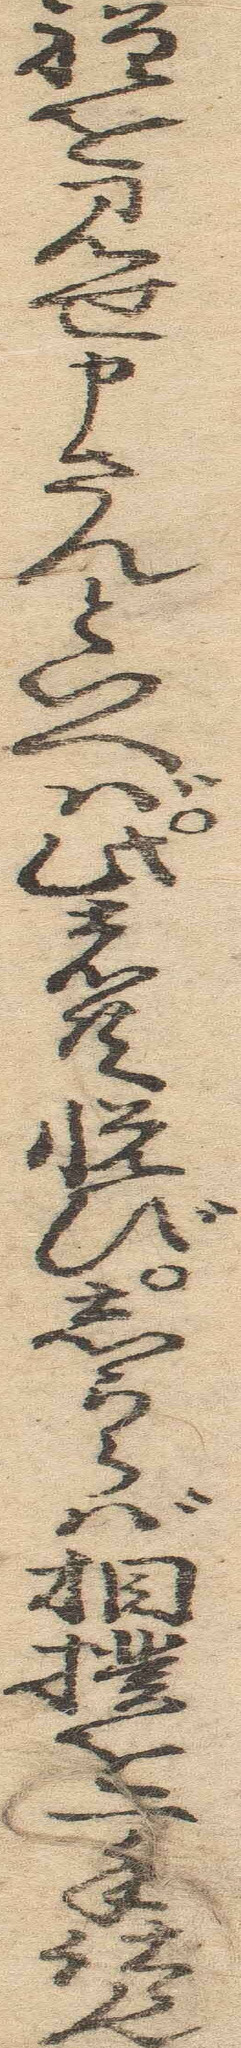程を見せ申さんといへば此者共悦び。しからば相撲を一手仕ん
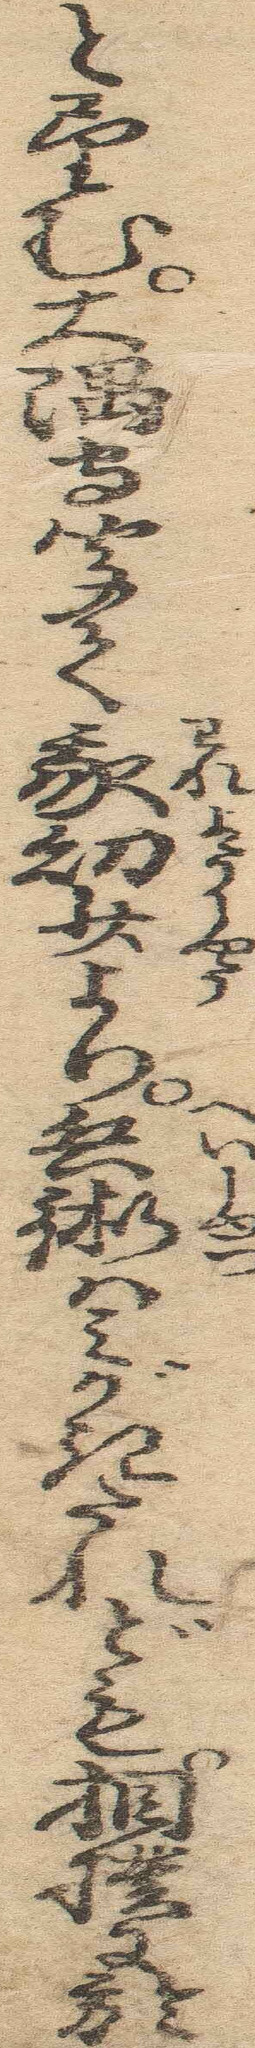と望む。大隅守聞て我幼少より。兵術はぐくみたれども。相撲に於
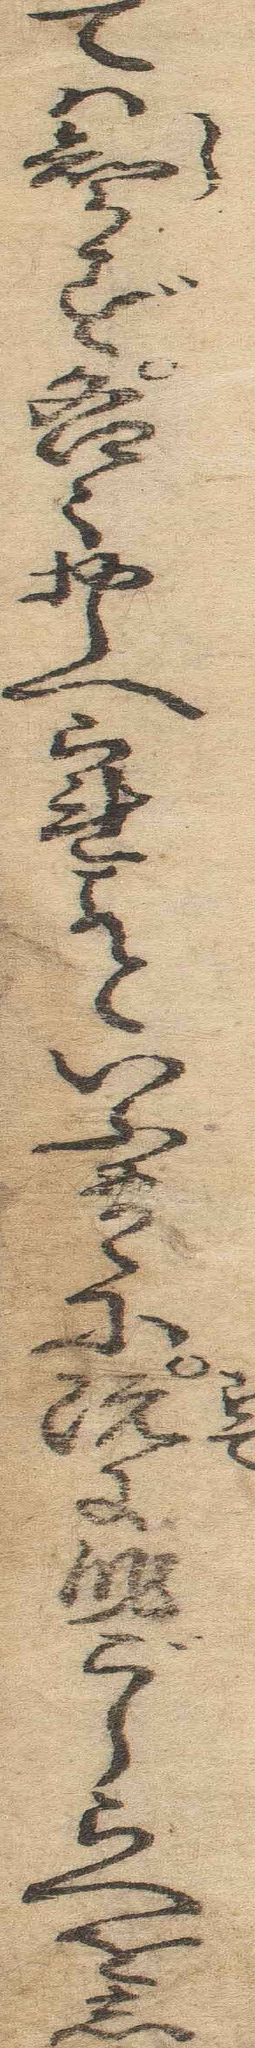ては知らず。各々おしへられよといふけるに既に身ごしらへをし

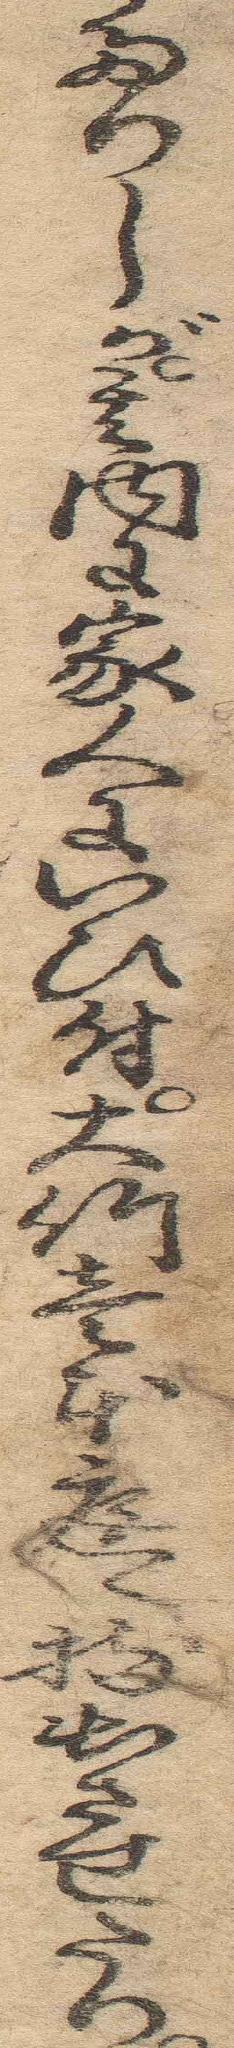たりしが。其内に家人にいひ付。大竹壱本庭へ持出させたるり。
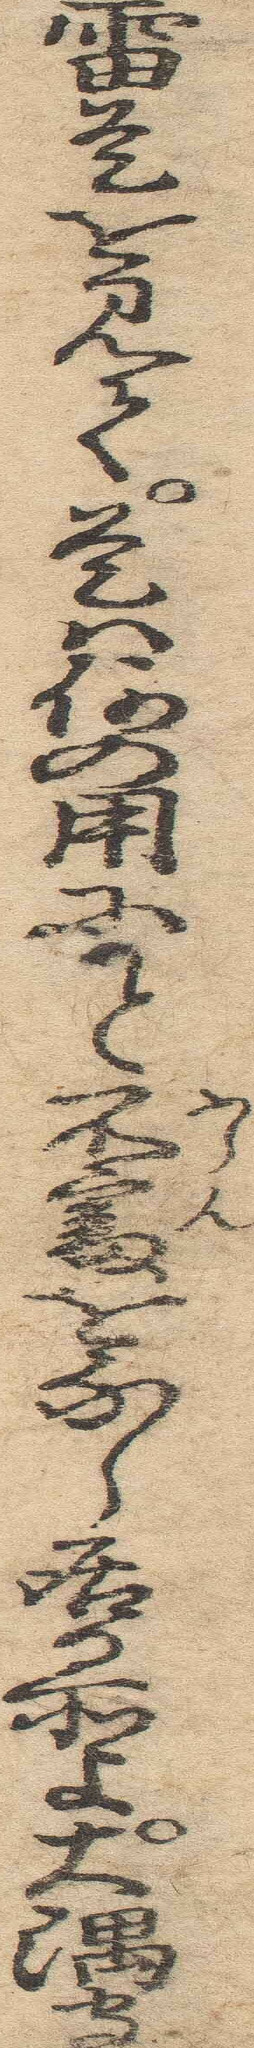雷是を見て。是は何の用にかと不審をなし居る所に。大隅守
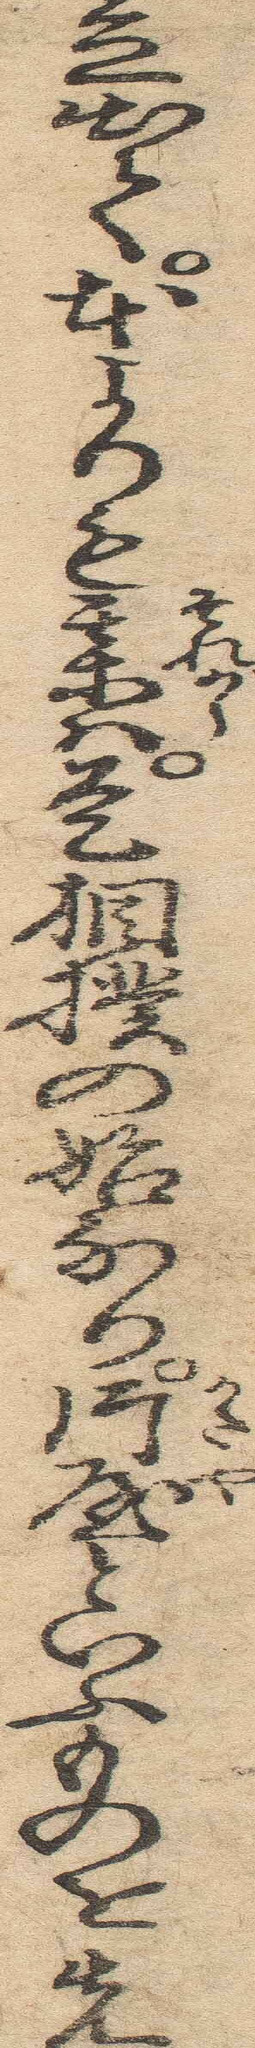立出て。本よりも某ハ。是相撲の始なり。片屋といふものを先
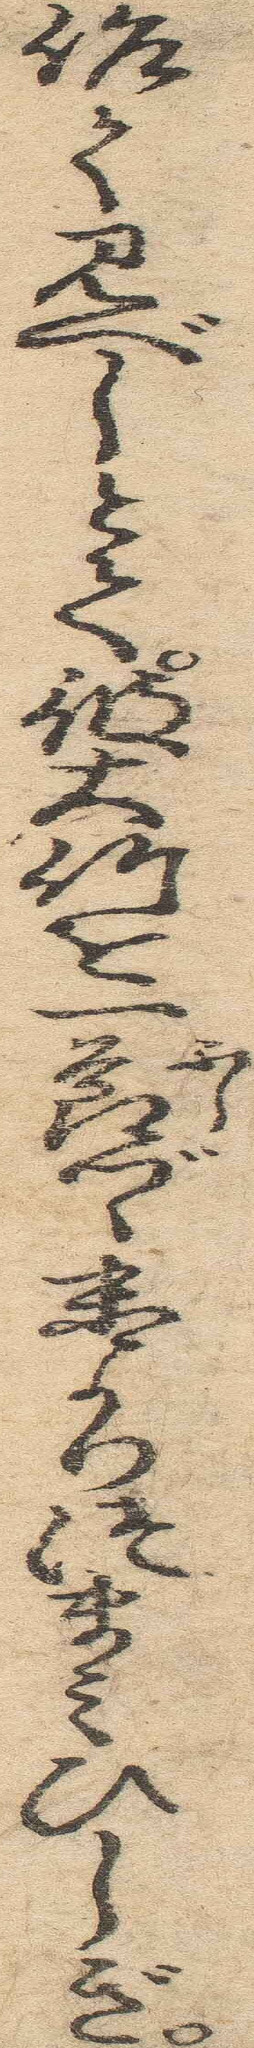作て見べしとて。彼大竹を一節づゝ末よりつまみひしぎ
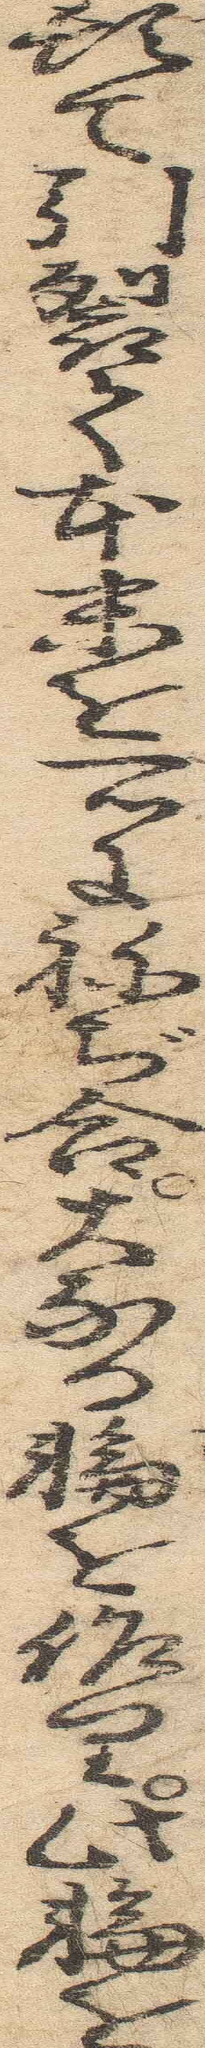頓て引裂て本末を一ツにねぢ合。輪を作り此輪を
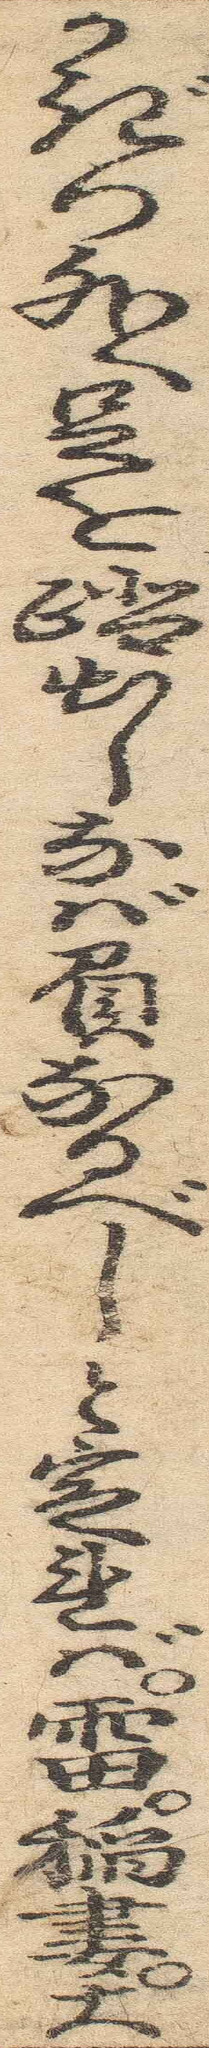かぎり外へ足を踏出しなば。負なるべしと定れば。雷。稲妻。大
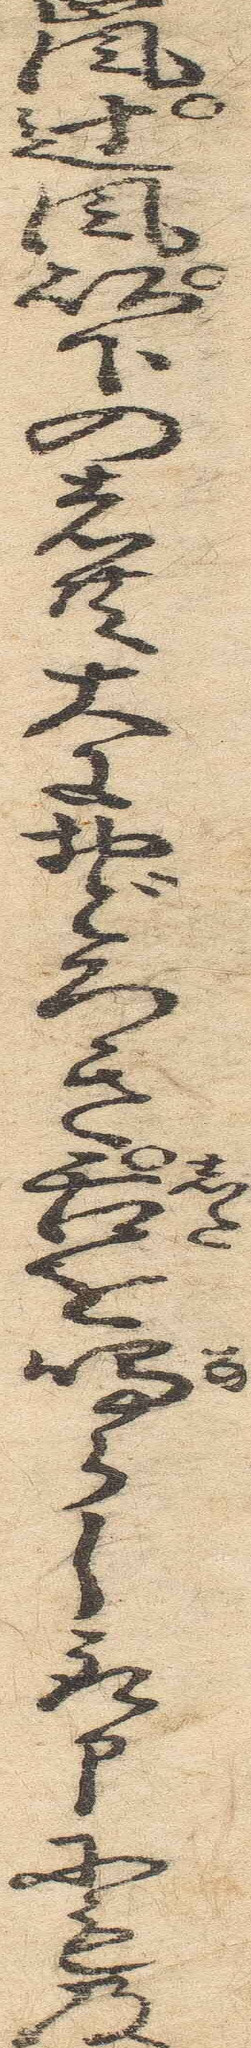嵐。辻風。以下の者共大におどろき舌を鳴らし取申にも及
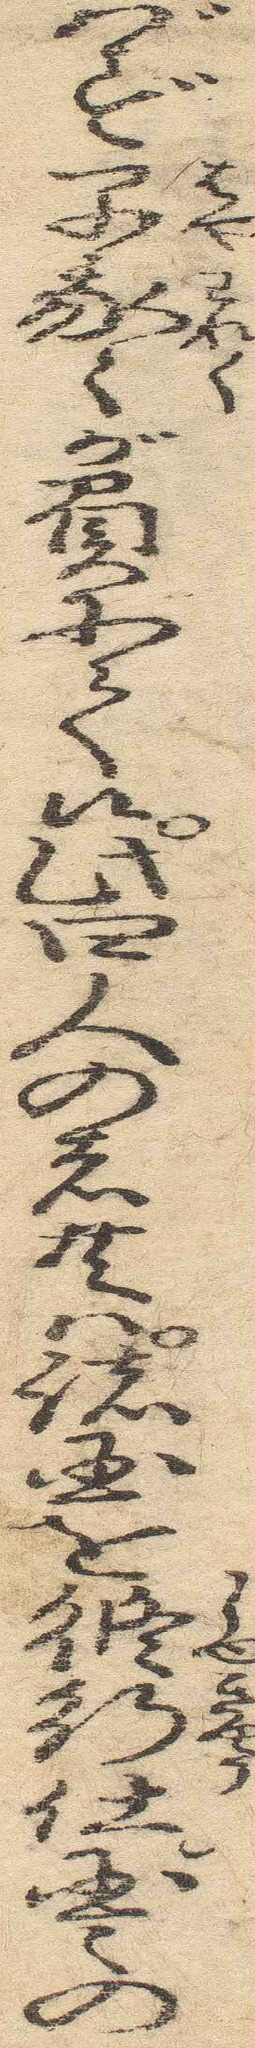ばず早我々が負にて候。此四人の者共は。諸国を修行仕。国々の
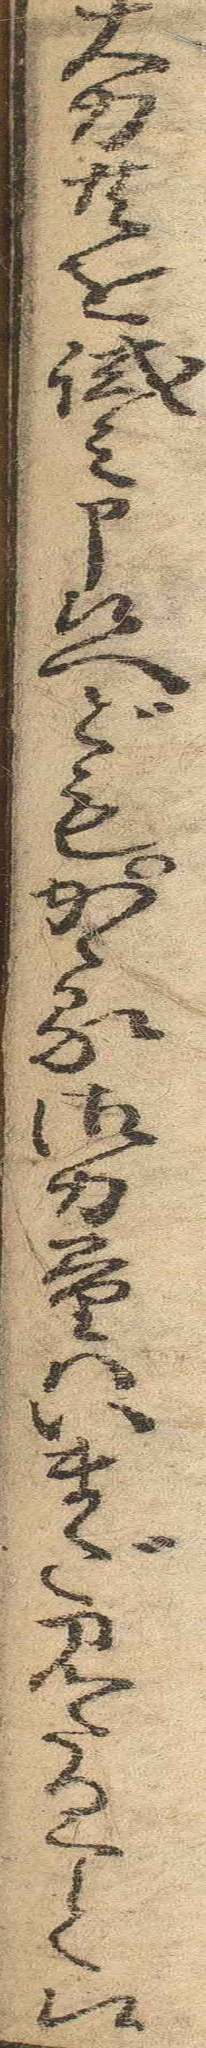大力共を試みし申候へども。かゝる御力量はいまだ見たること候
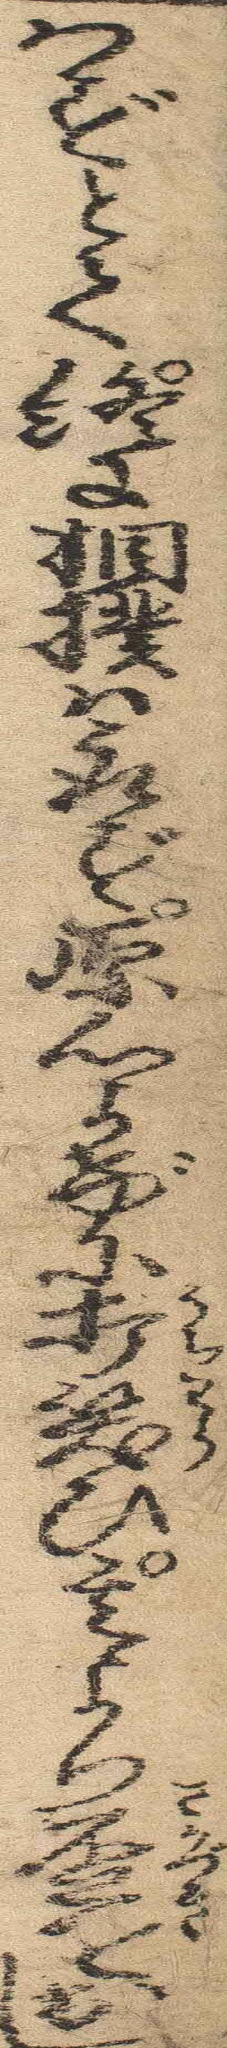はずとて。終に相撲は取ず。原心より希に打笑ひ。其より盃を出し
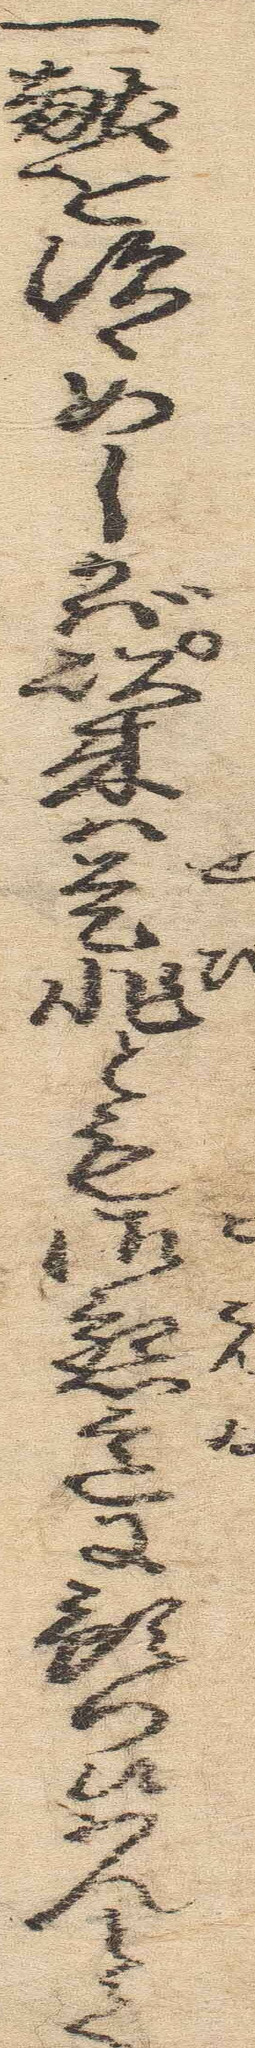一献を始めしかば。以来は是非とも御懇意に預り候はんとて
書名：古今相撲大全
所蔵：東京学芸大学附属図書館 国文学研究資料館
